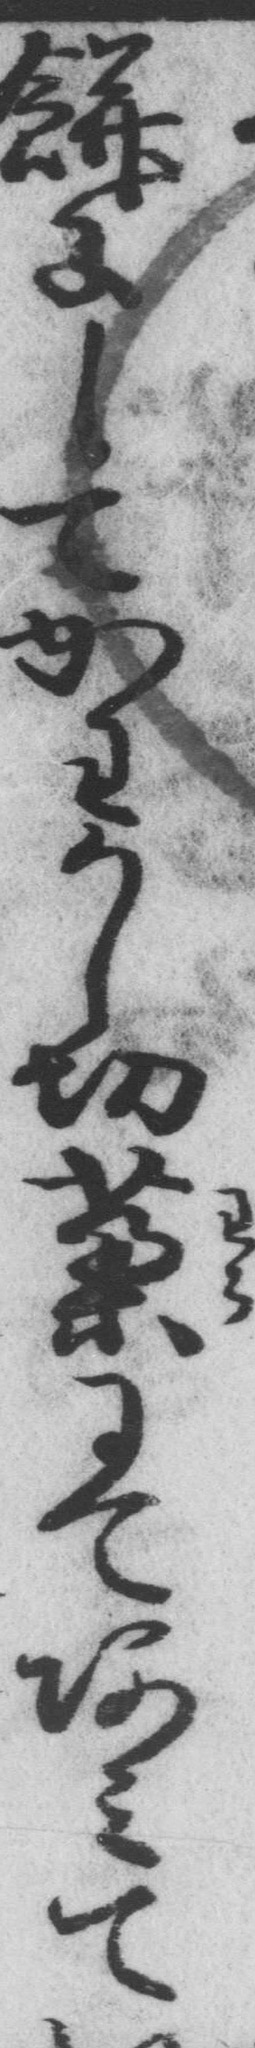餅にしてかわかし切藁にてあみて風の
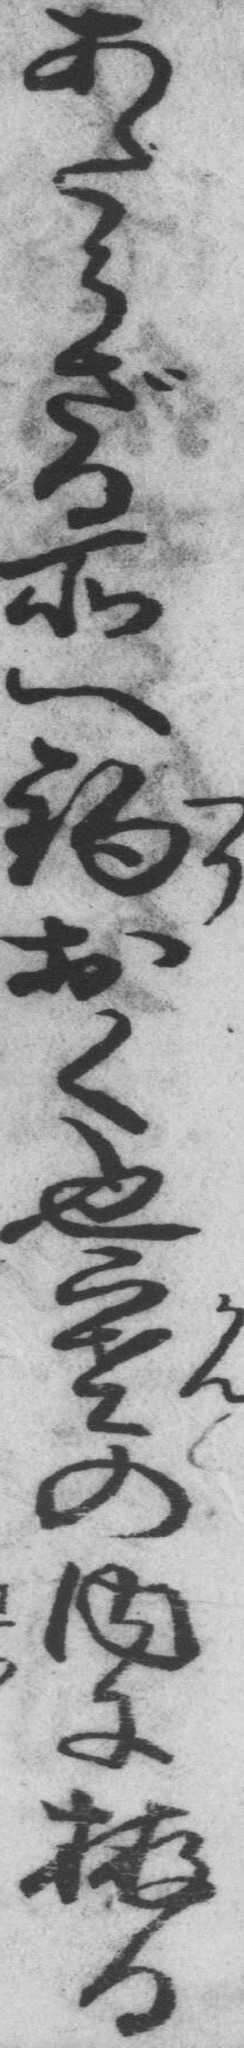あたらざる所へ釣おく也寒の内に拵る
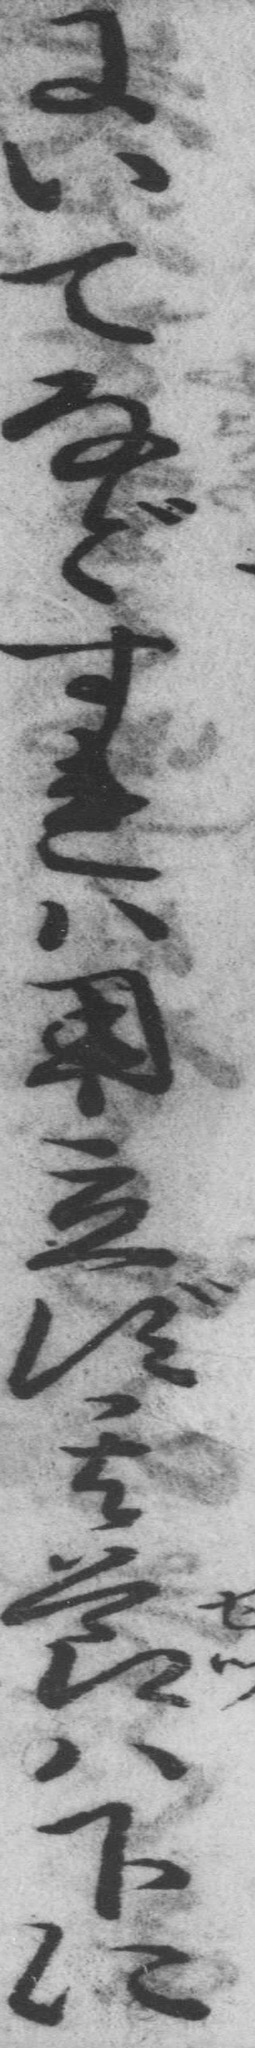にいてなどすれは用立ず其節は下に

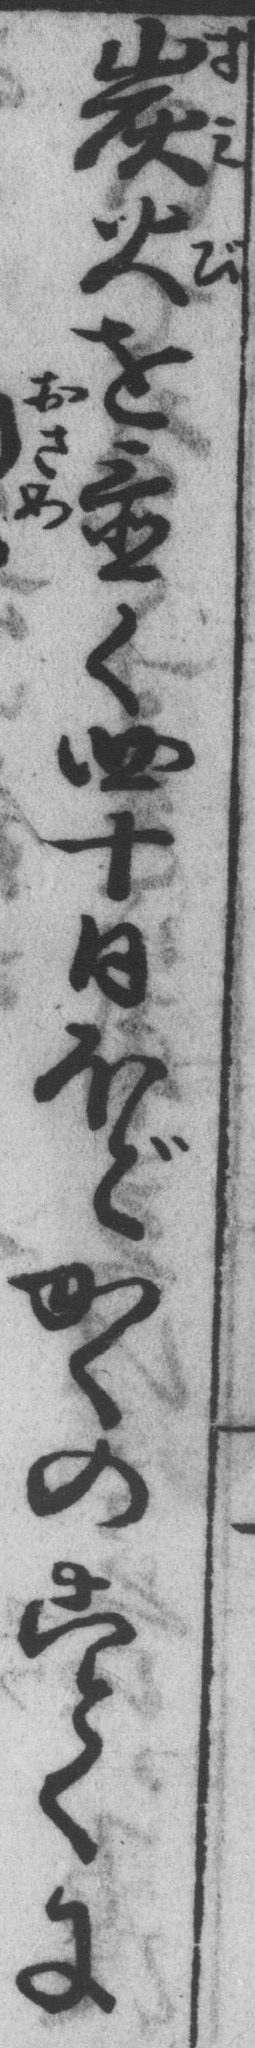炭火を置く四十日ほどかくのことくに
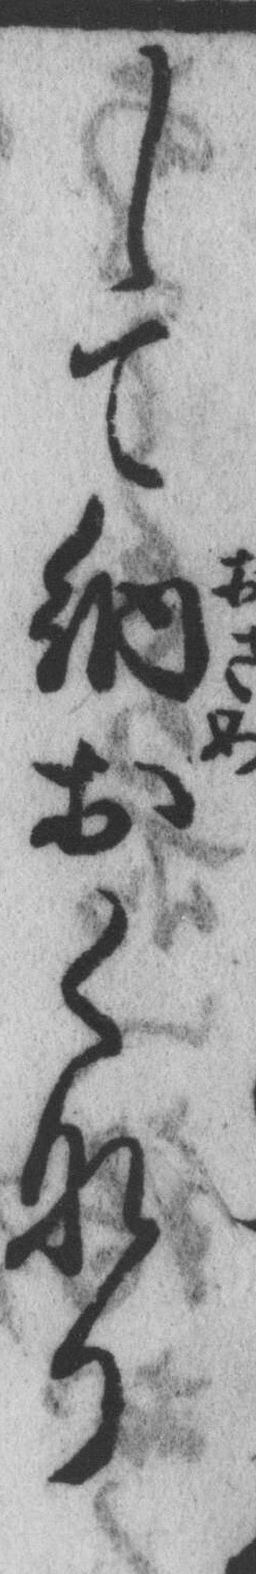して納おくなり
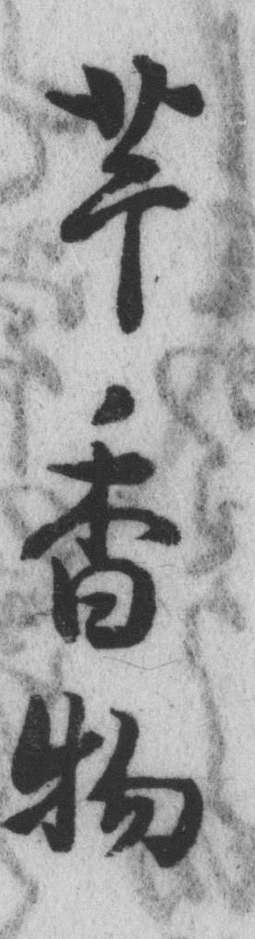芋香物
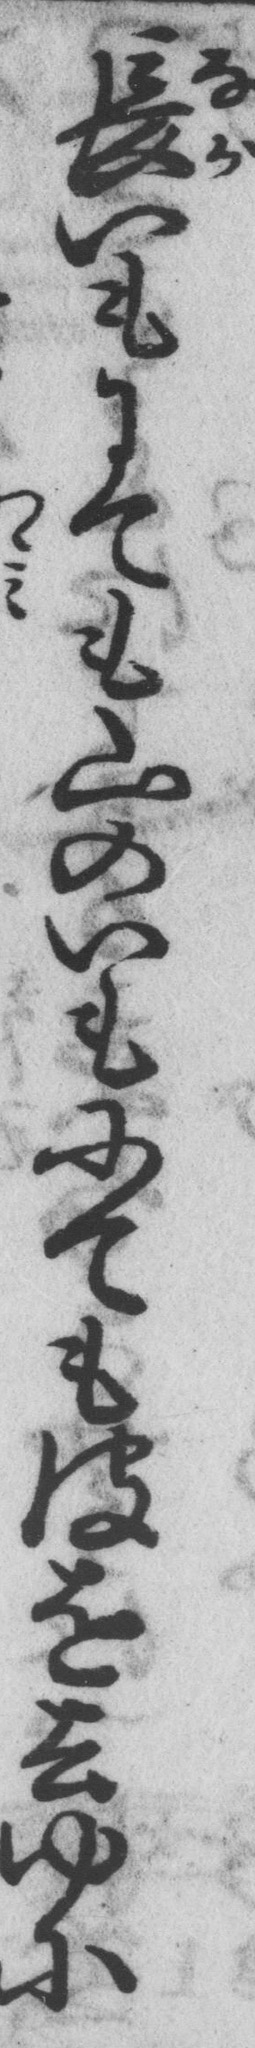長いもにても山のいもにても皮を去ゆに
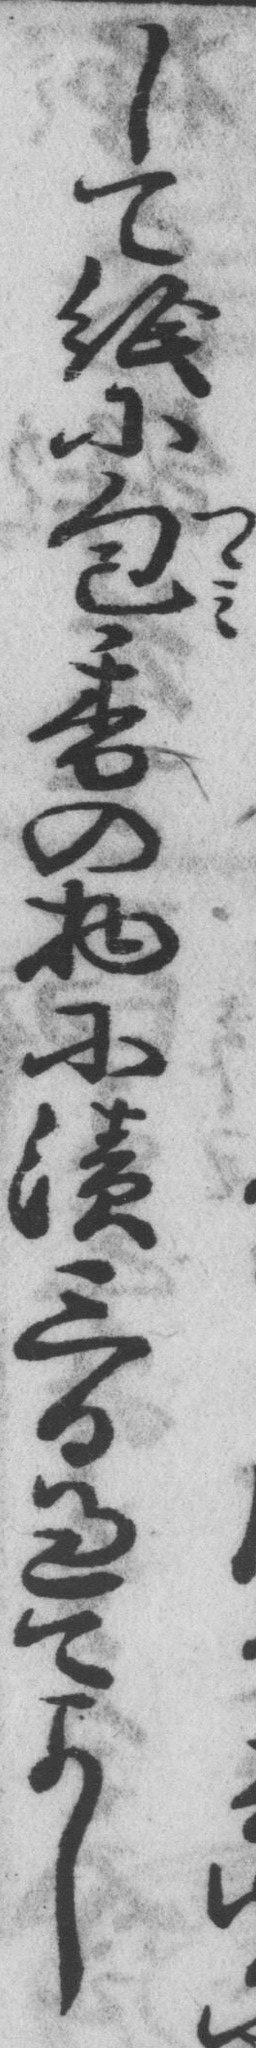して紙に包香の物に漬三日過てよし
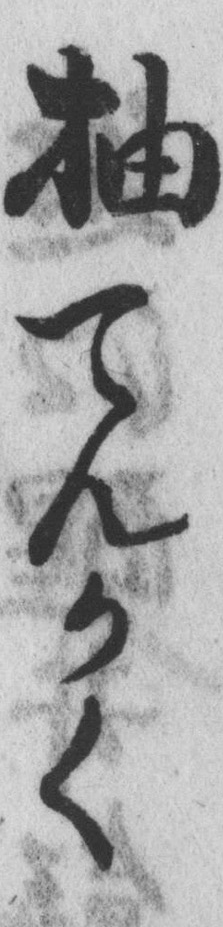柚てんかく
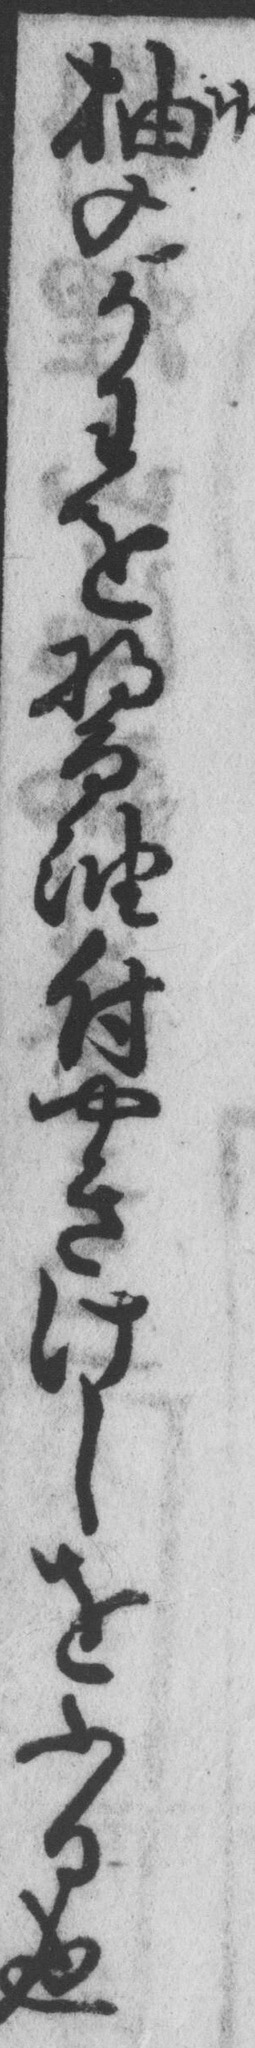柚のかわを醤油付やきけしをふる也
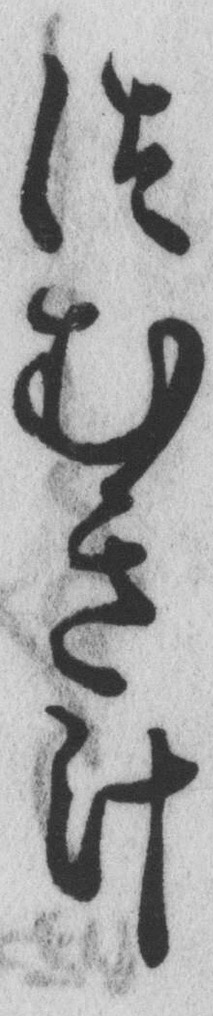つむき汁
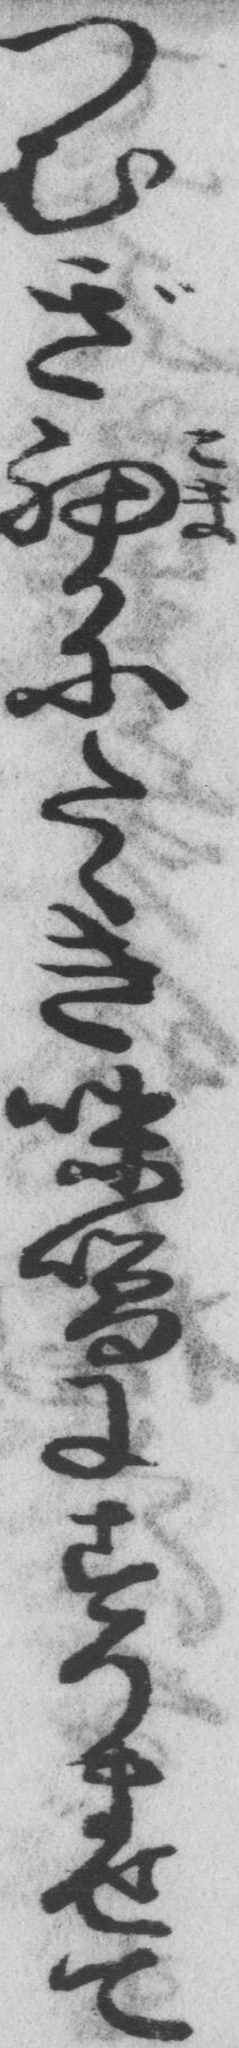つむぎ細かにたゝき味噌にすりませて
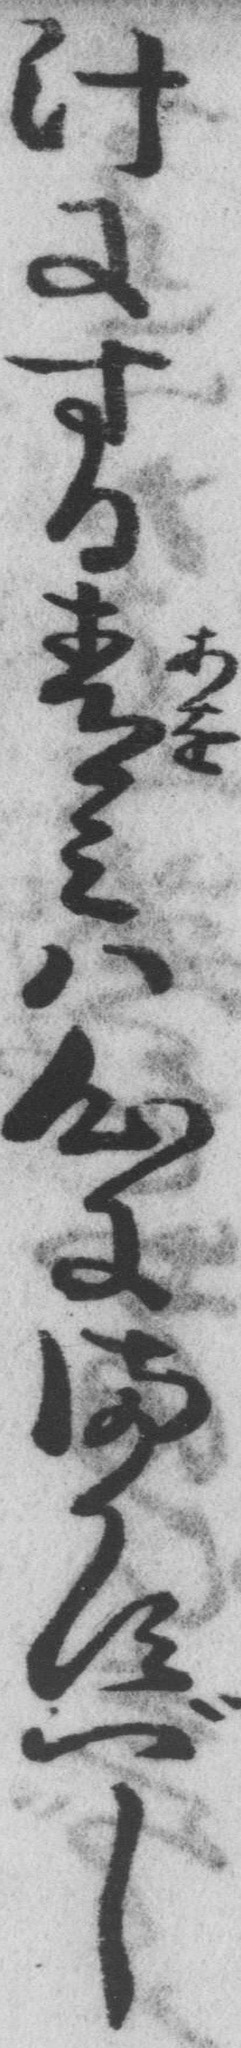汁にする青みは心にまかすべし
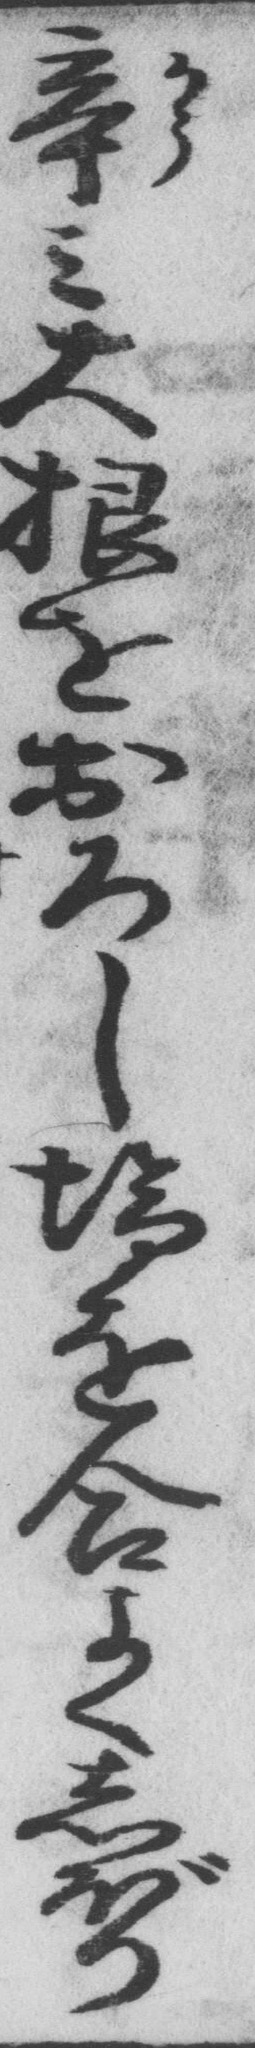辛み大根をおろし塩を合よくしぼり
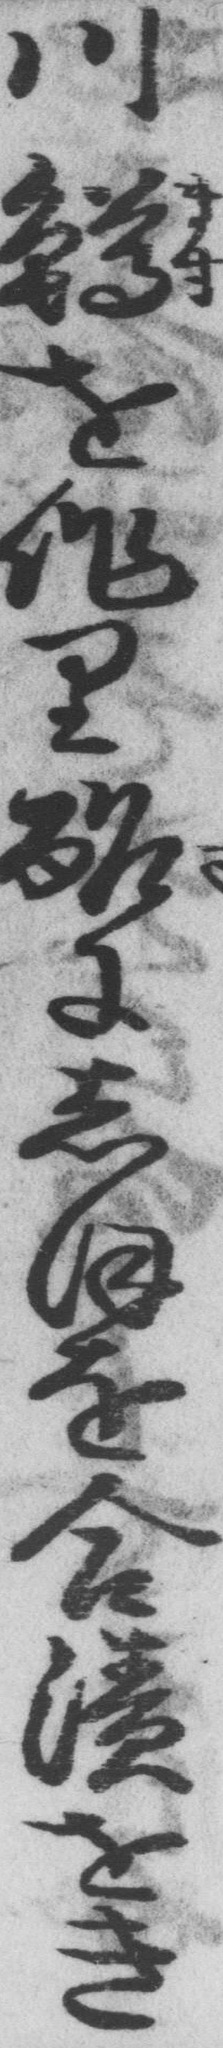川鱒を作り酢にしほを合漬をき
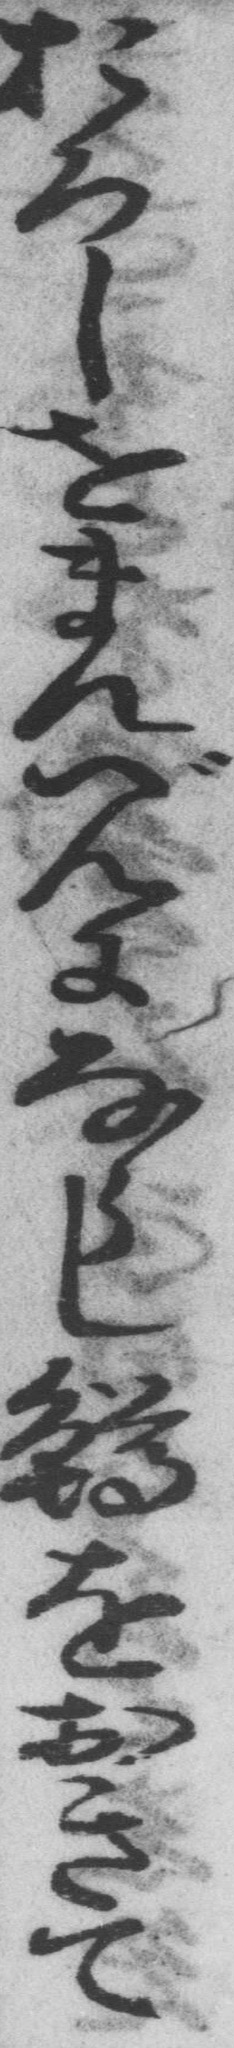おろしをまんべんにならし鱒をおきて
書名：料理山海郷
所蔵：大阪府立大学学術情報センター 国文学研究資料館
